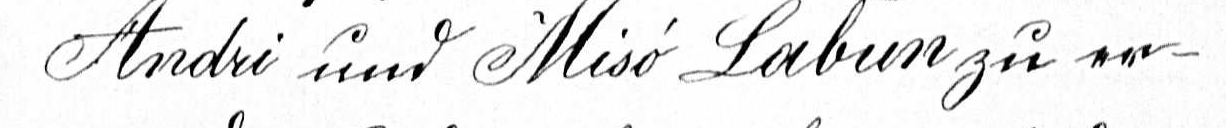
Andri und Misó Labun zu er¬
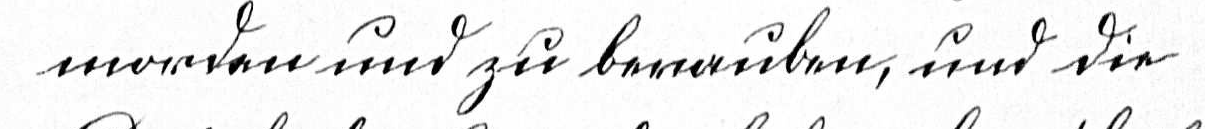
morden und zu berauben, und die
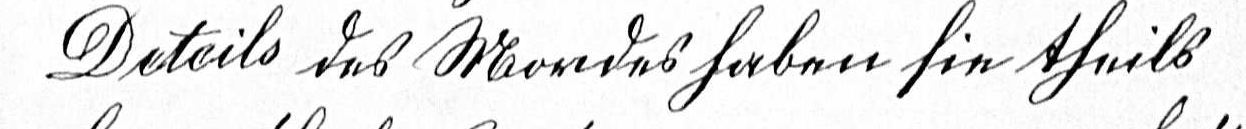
Deteils des Mordes haben sie theils
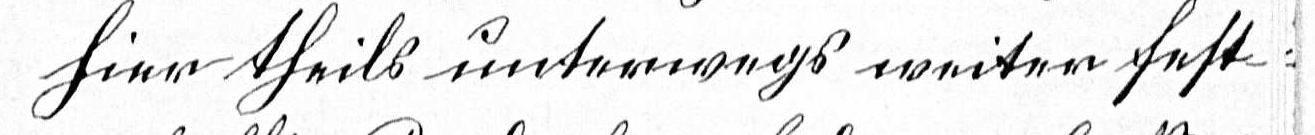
hier theils unterwegs weiter fest¬
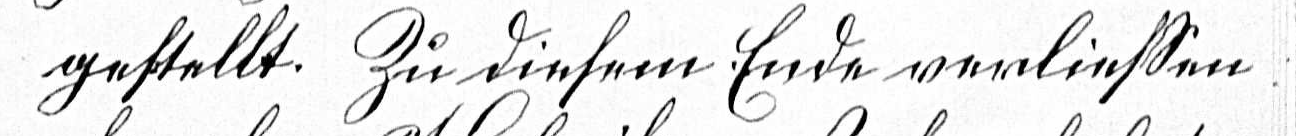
gestellt. Zu diesem Ende verließen
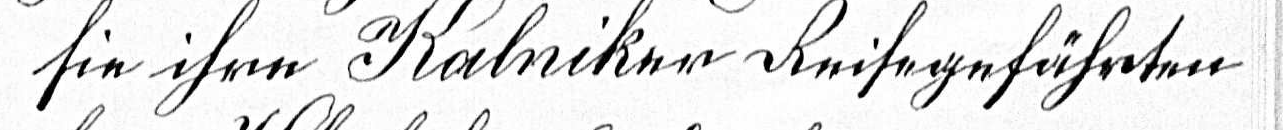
sie ihre Kalniker Reisegefährten
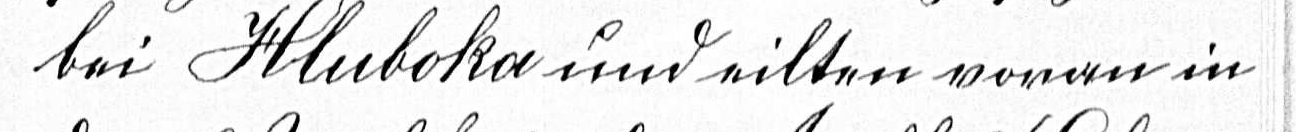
bei Hluboka und eilten voran in
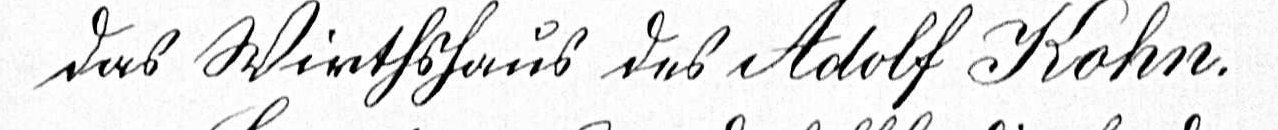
das Wirthshaus des Adolf Kohn.
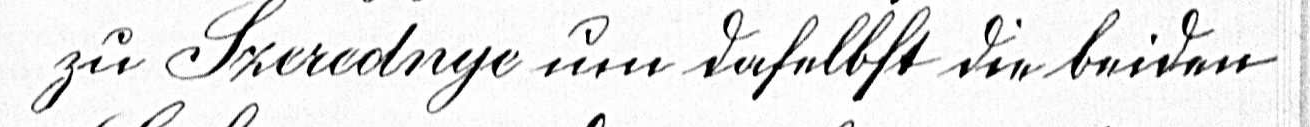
zu Szerednye um daselbst die beiden
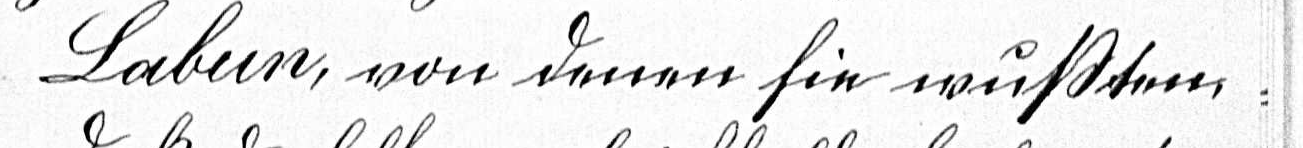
Labun, von denen sie wußten,
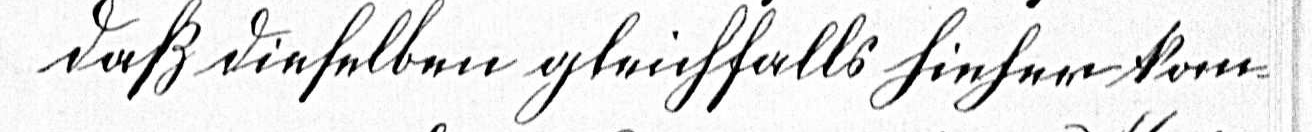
daß dieselben gleichfalls hieher kom¬
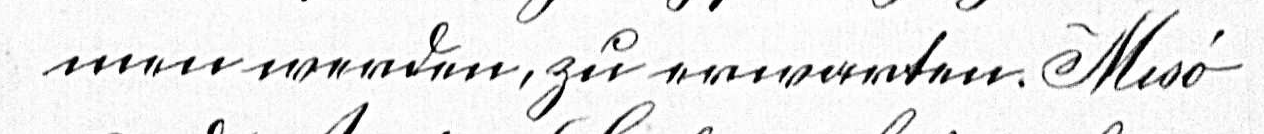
men werden, zu erwanten. Misó
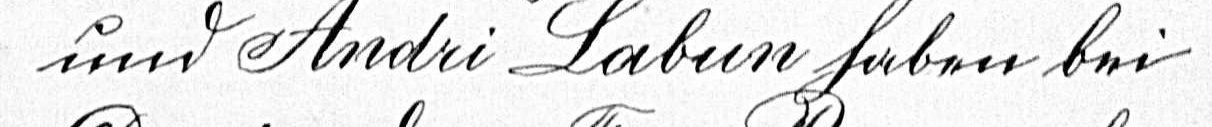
und Andri Labun haben bei
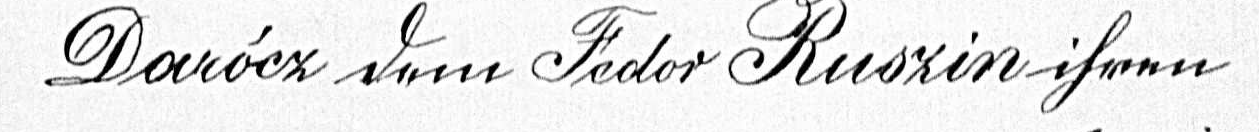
Darócz dem Fedor Ruszin ihren
